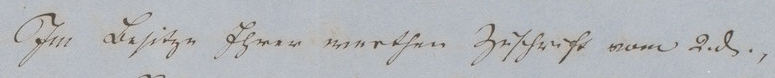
Im Besitze Ihrer werthen Zuschrift vom 2. d.,
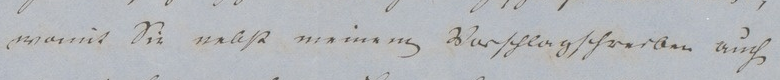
womit Sie nebst meinem Vorschlagschreiben auch
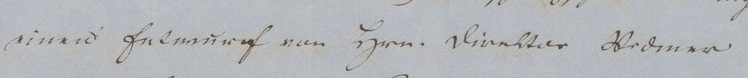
einen Entwurf von Hrn. Direktor Widmer
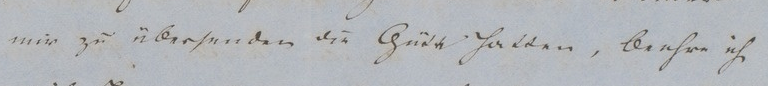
mir zu übersenden die Güte hatten, beehre ich
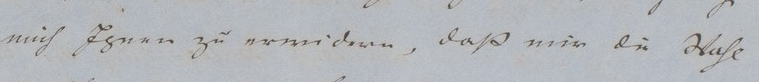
mich Ihnen zu erwidern, daß mir die Wahl
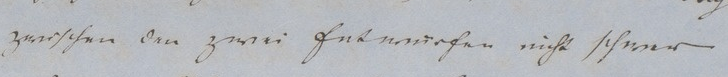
zwischen den zwei Entwürfen nicht schwer
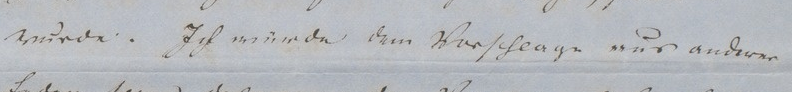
wurde. Ich würde dem Vorschlage aus anderer
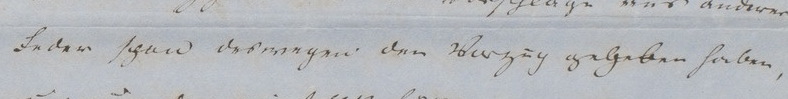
Feder schon deswegen den Vorzug gegeben haben,
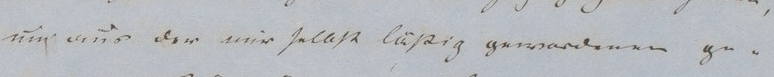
um aus der mir selbst lästig gewordenen ge-
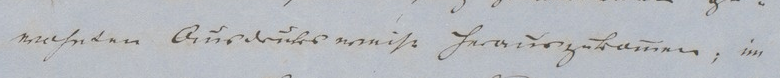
wohnten Ausdruksweise herauszukommen; im
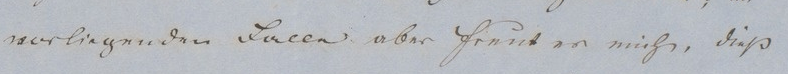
vorliegenden Falle aber freut es mich, dieß
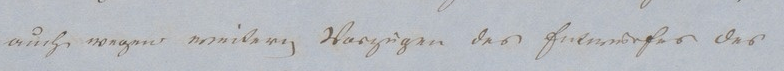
auch wegen weitern Vorzügen des Entwurfes des
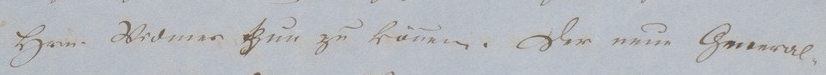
Hrn. Widmer thun zu können.Der neue General-
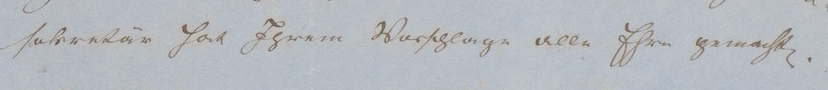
sekretär hat Ihrem Vorschlage alle Ehre gemacht.
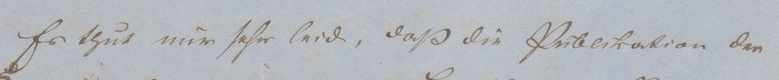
Es thut mir sehr leid, daß die Publikation der
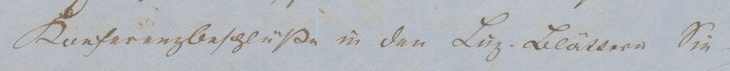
Konferenzbeschlüße in den Luz. Blättern Sie
